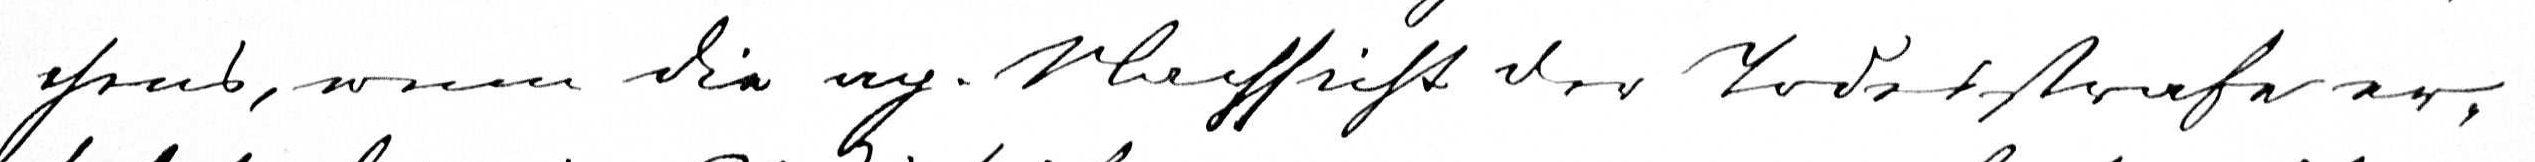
chens wenn die ag. Nachsicht der Todesstrafe er¬
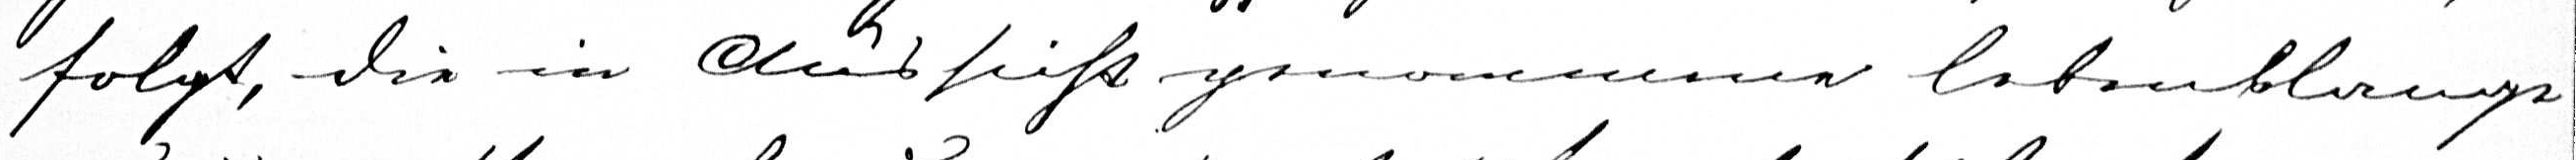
folgt, die in Aussicht genommene lebenslange
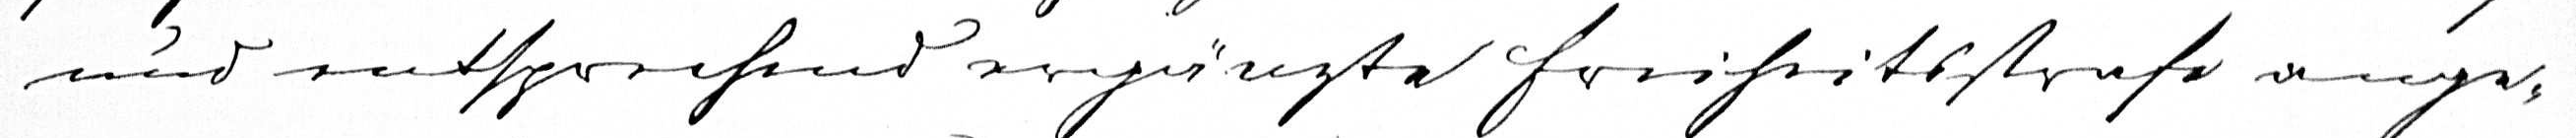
und entsprechend ergänzte Freiheitsstrafe ange¬
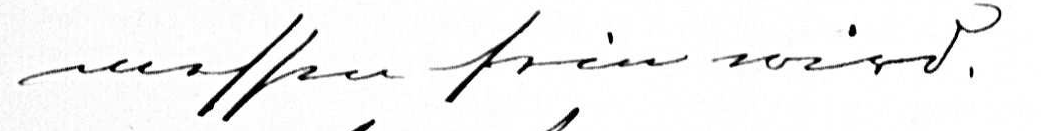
messen sein wird.
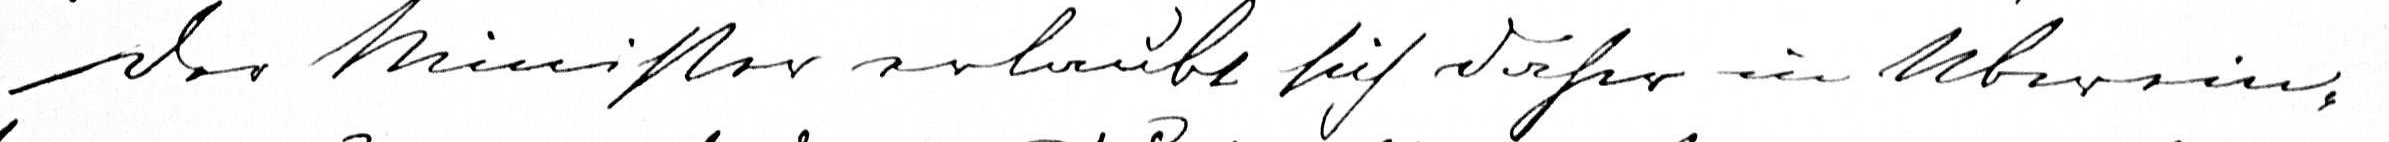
Der Minister erlaubt sich daher in Überein¬
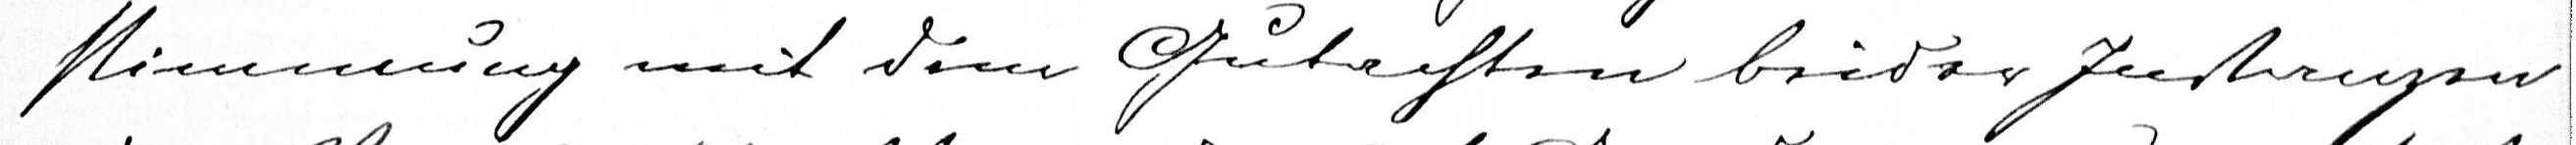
stimmung mit dem Gutachten beider Instanzen
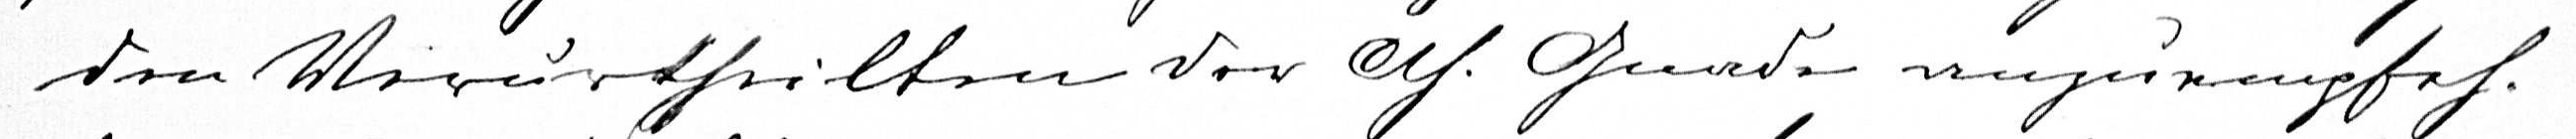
den Verurtheilten der Ah. Gnade anzuempfeh¬
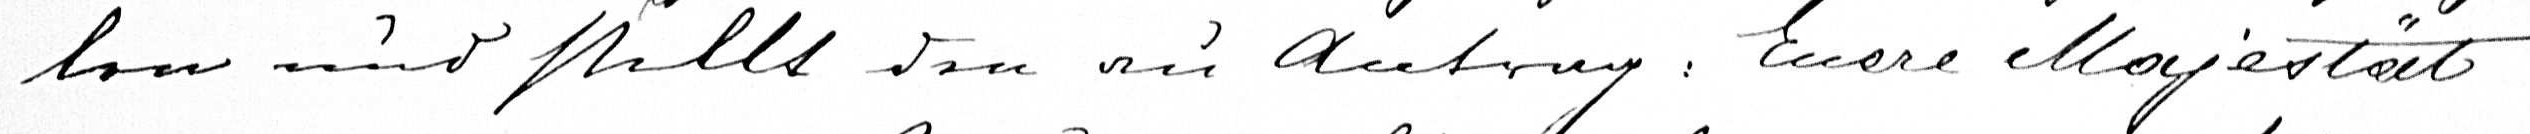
len und stellt den au. Antrag: Euere Majestät
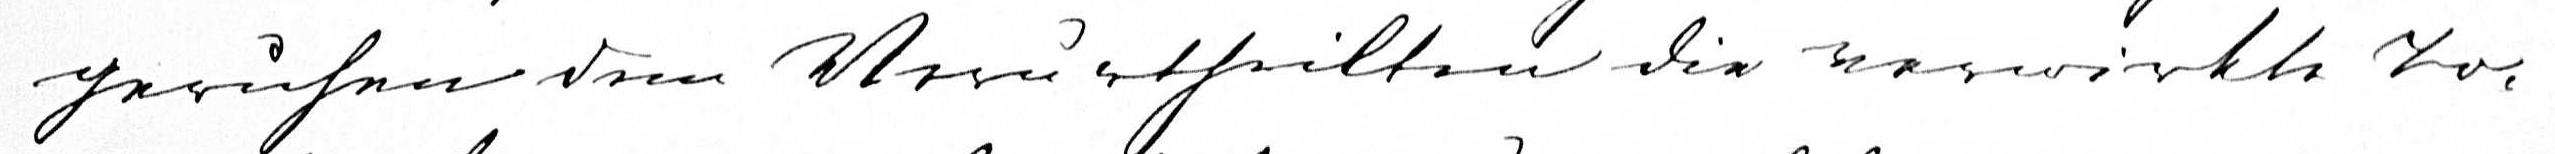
geruhen dem Verurtheilten die verwirkte To¬
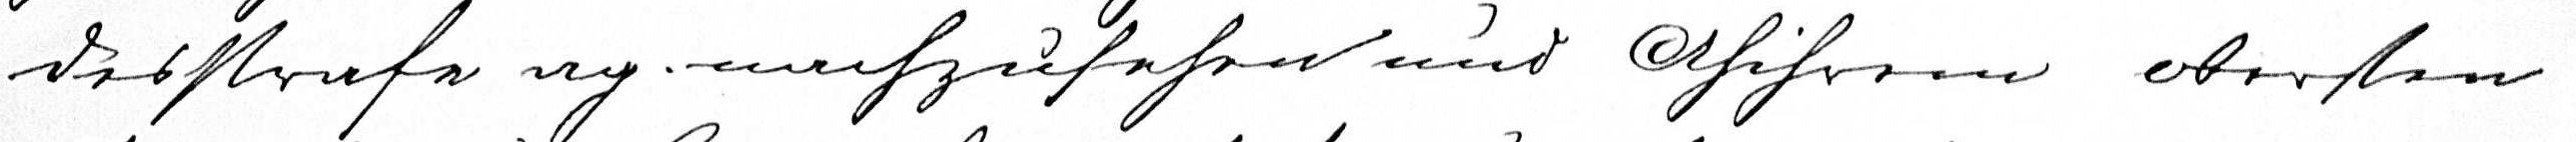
desstrafe ag. nachzusehen und Ahihrem obersten
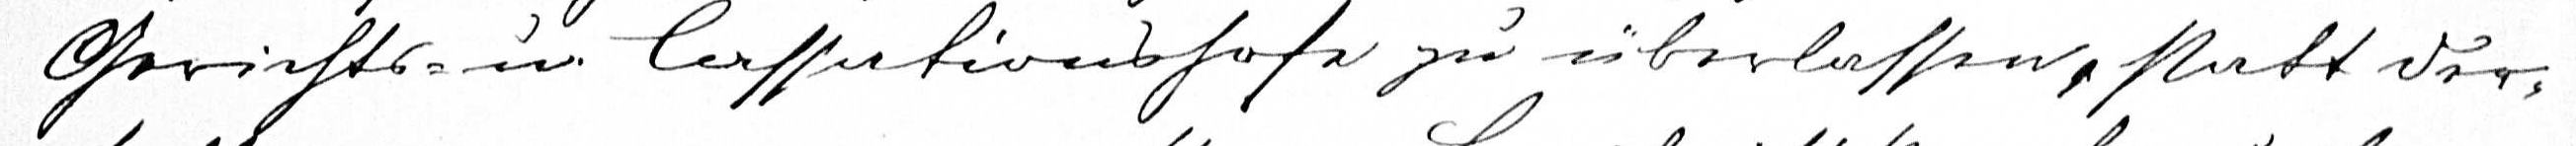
Gerichts- und Cassationshofe zu überlassen, statt der¬
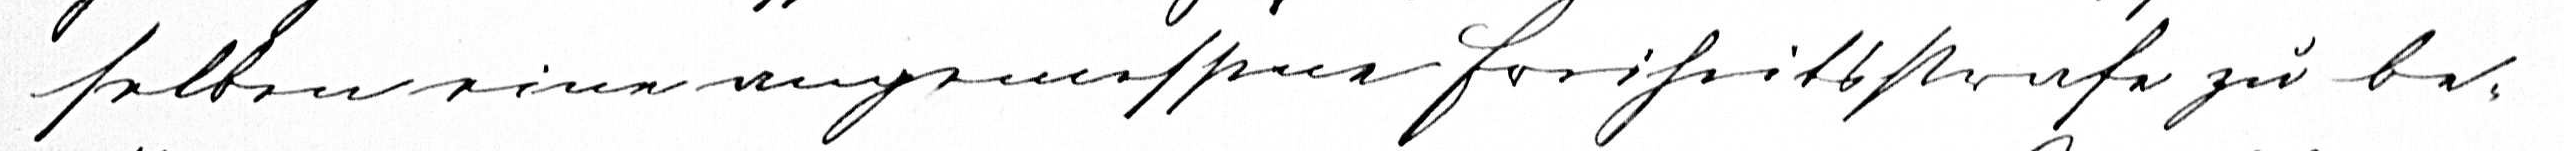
selben eine angemessene Freiheitsstrafe zu be¬
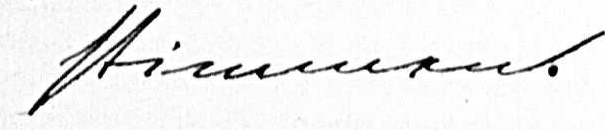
stimmen.
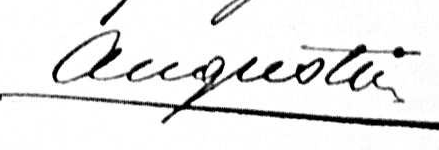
Augustin
